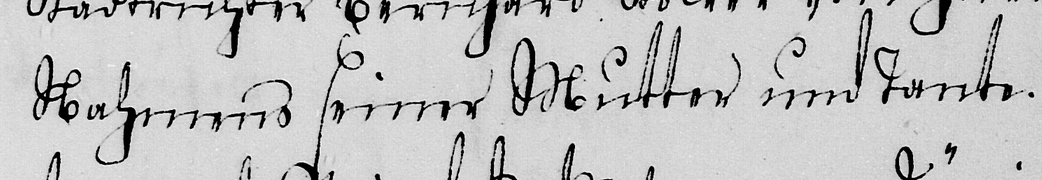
Nahmens seiner Mutter und Tante.
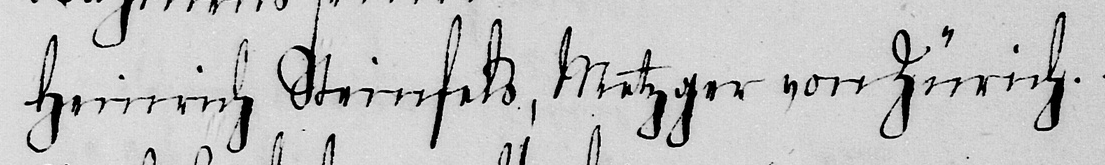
Heinrich Steinfels, Metzger von Zürich.
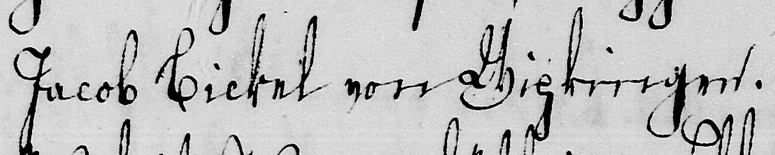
Jacob Bickel von Wipkingen.
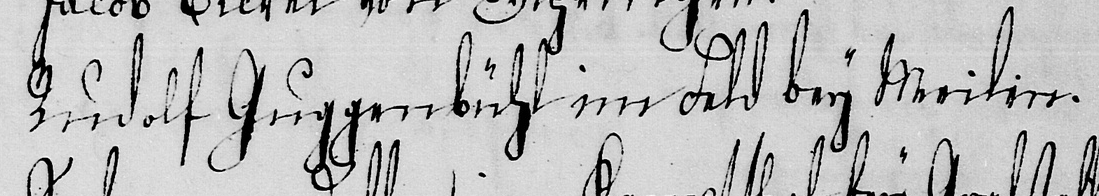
Rudolf Guggenbühl im Feld bey Meilen.
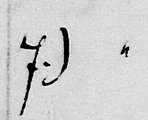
J.
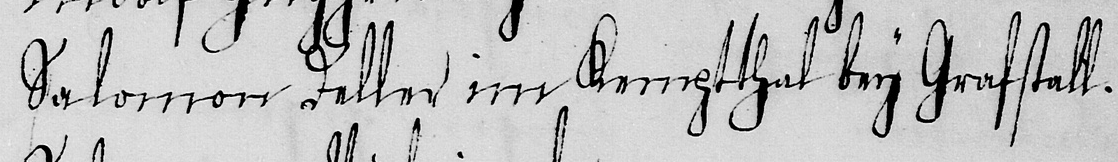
Salomon Feller im Kempthal bey Grafstall.
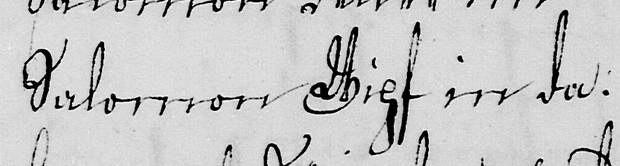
Salomon Wipf in da.
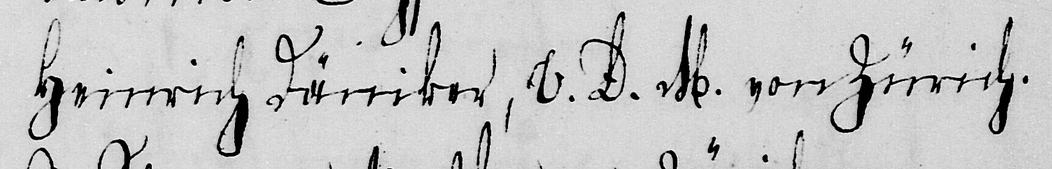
Heinrich Däniker, V. D. M. von Zürich
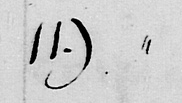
18.)
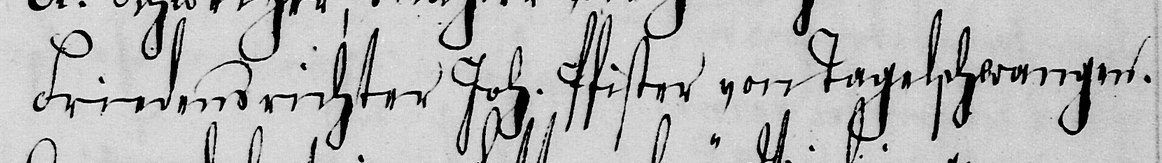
Friedensrichter Joh. Pfister von Tagelschwangen.
